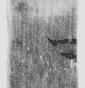二
